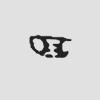四
